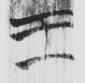王
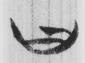曰
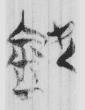欽
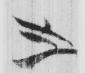之
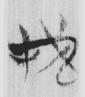{十戈}
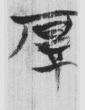厚
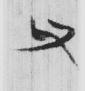父
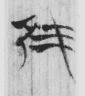隹
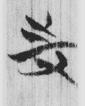寺
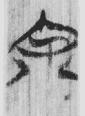余
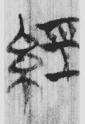經
